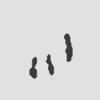亓（其）
